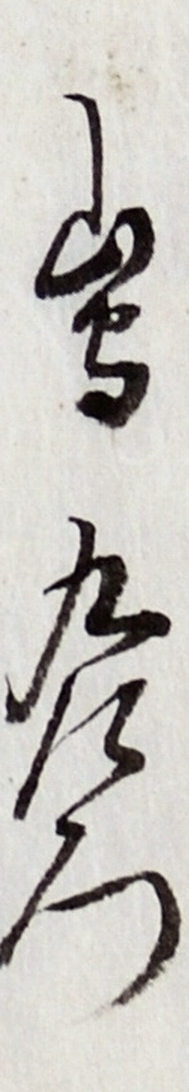同甚左衛門
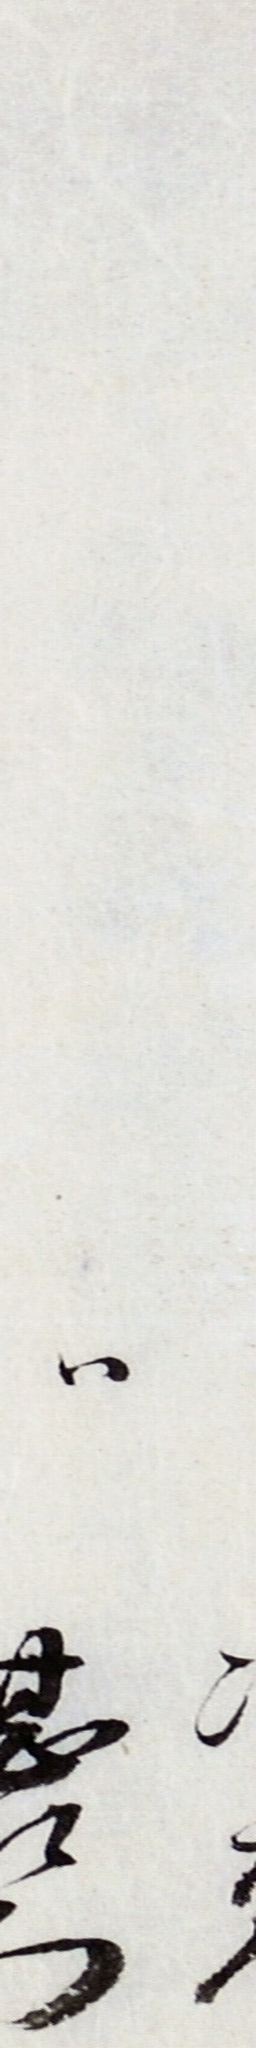同甚左衛門
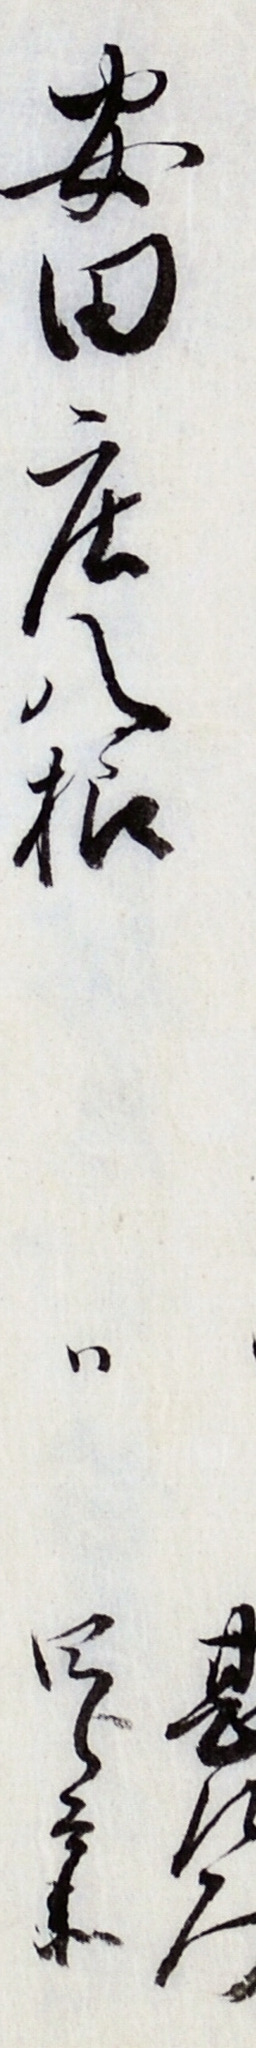安田庄八様同四郎兵衛
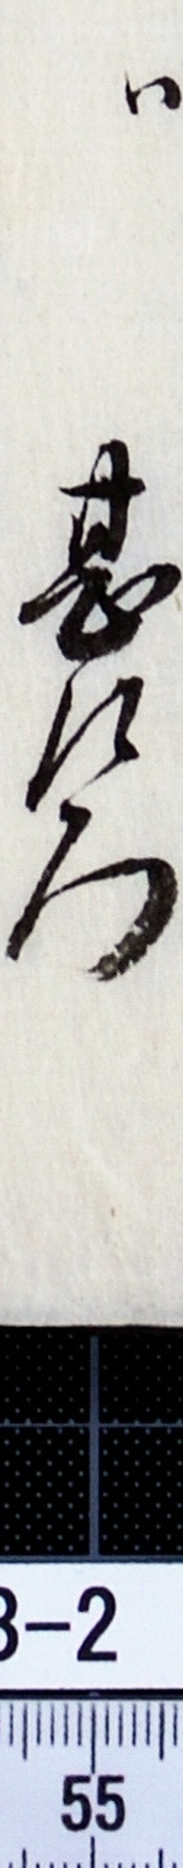同甚左衛門
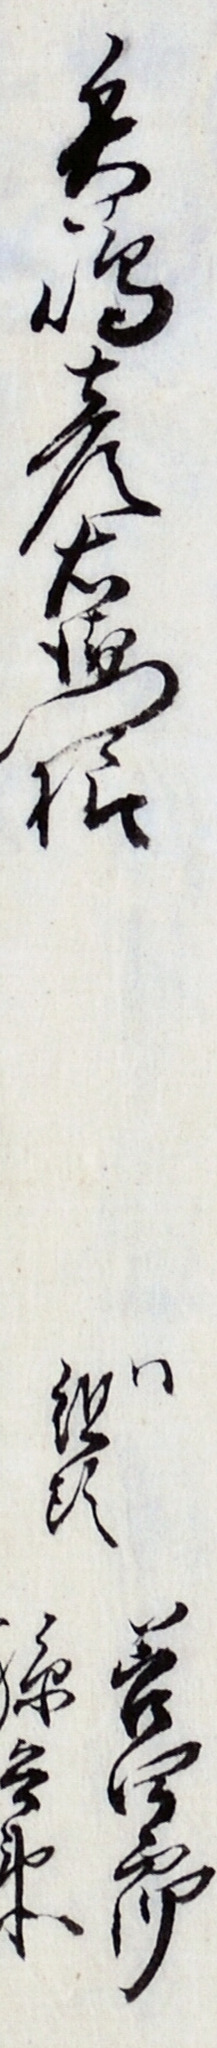矢嶋彦右衛門様同善四郎
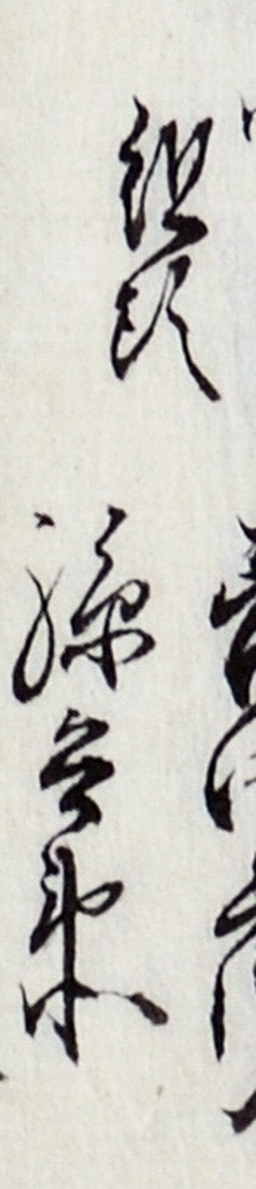組頭孫兵衛
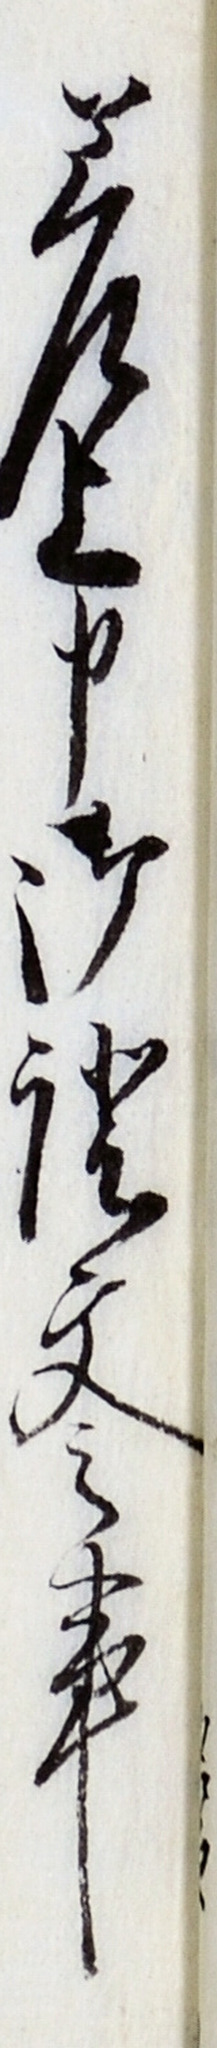差上申御証文之事
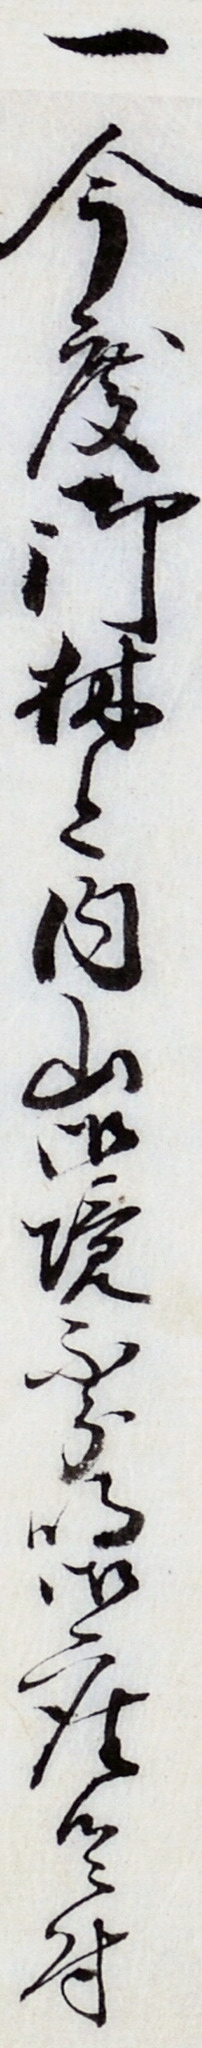一今度御林と内山御境不分明御座候ニ付
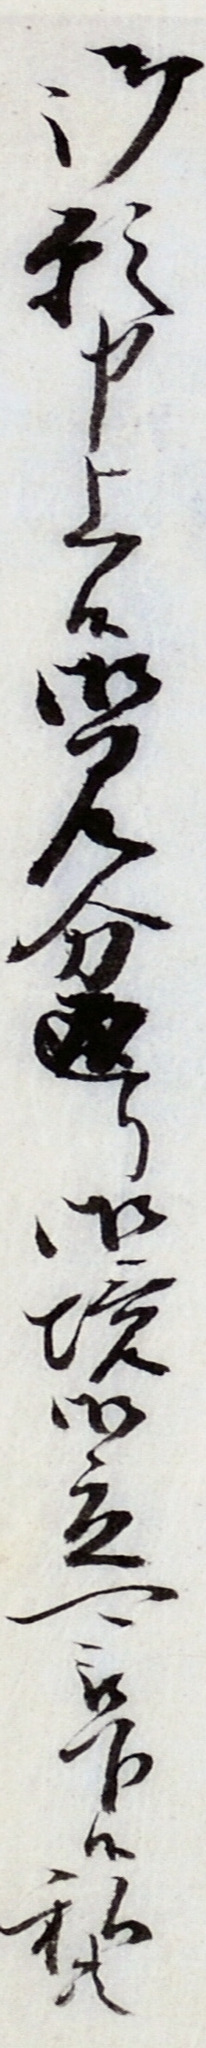御願申上候御見分通り御境御立可被下候私共
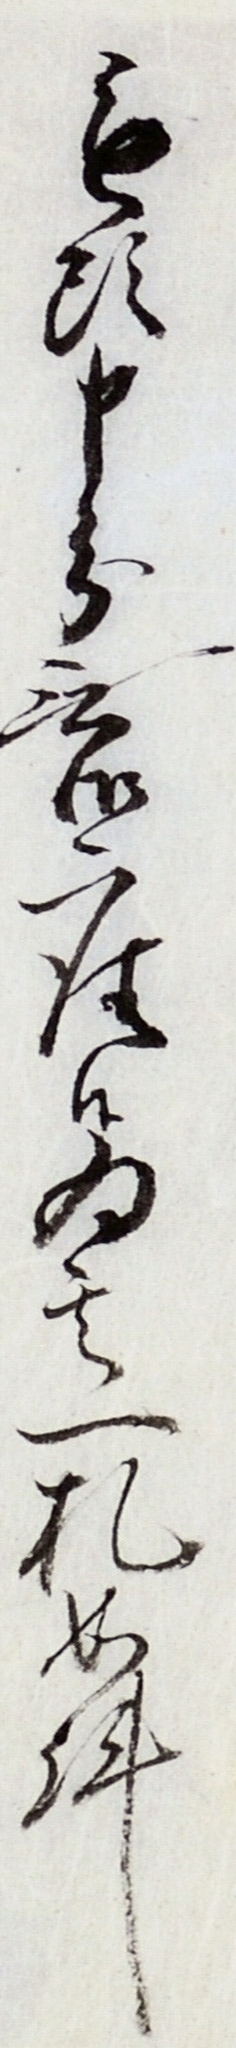毛頭申分無御座候為其一札如件
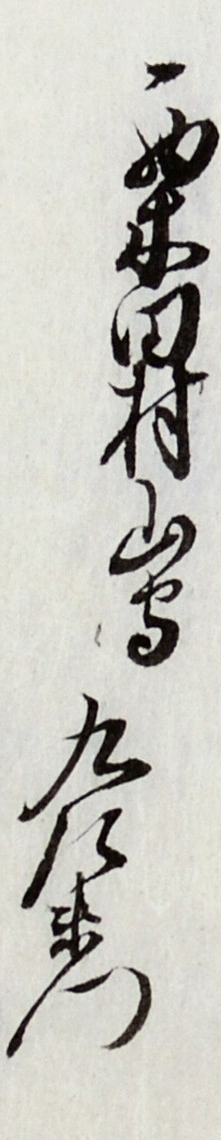栗田村山守九左衛門
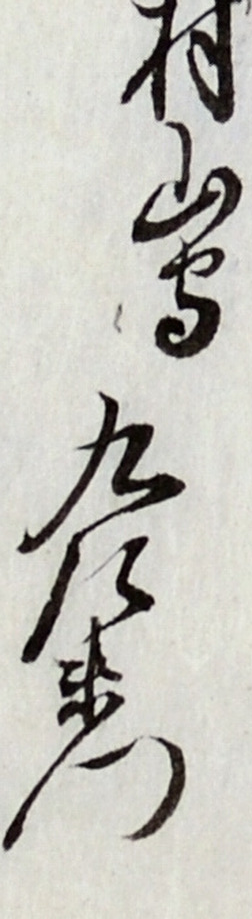栗田村山守九左衛門
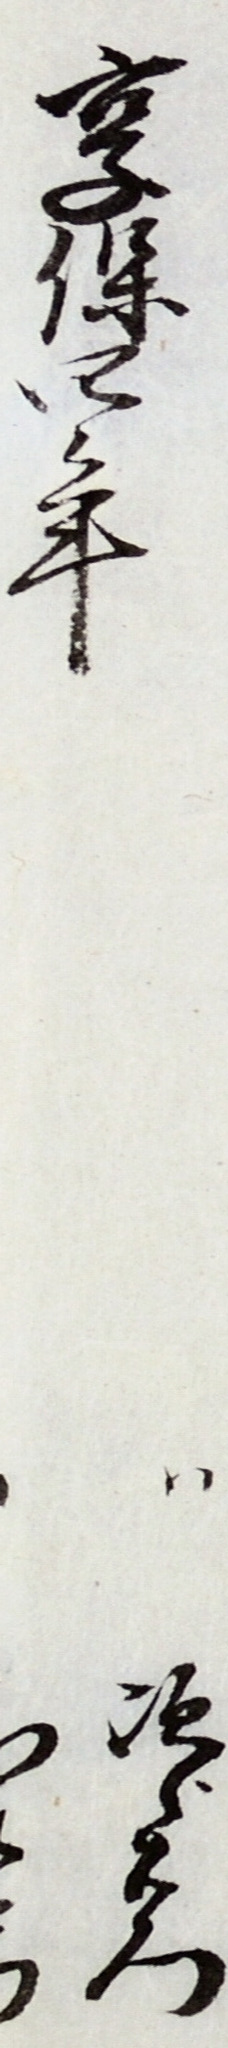享保四年同甚左衛門
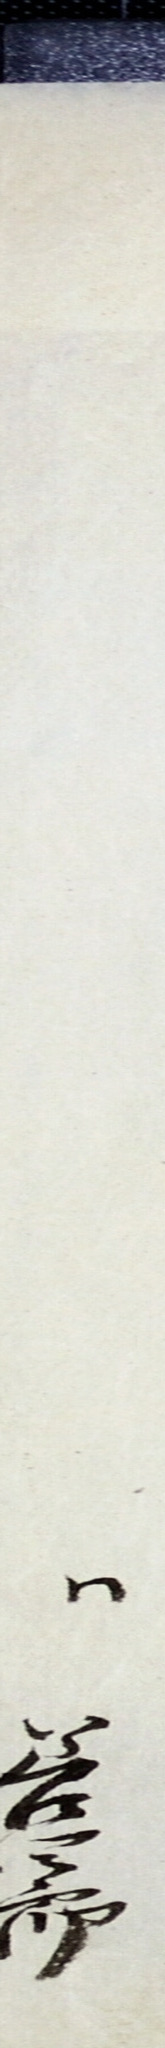同善四郎
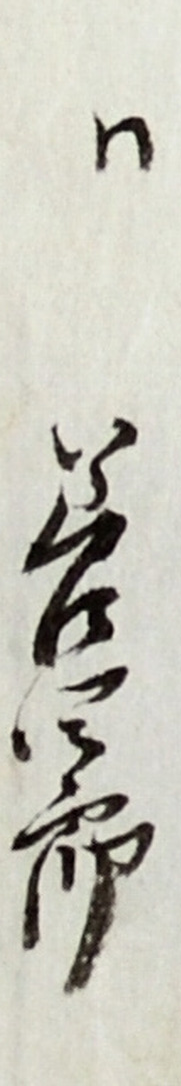同善四郎

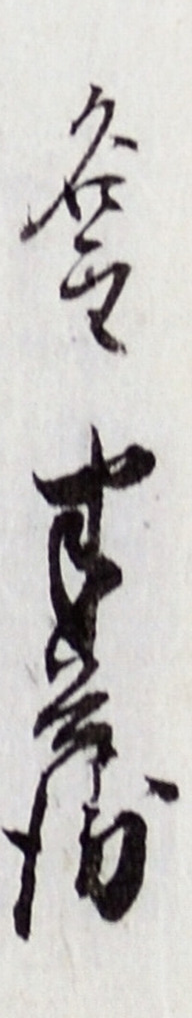名主半兵衛
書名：御林御竹藪証文控
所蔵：伊那市立高遠町図書館・合同会社AMANE
